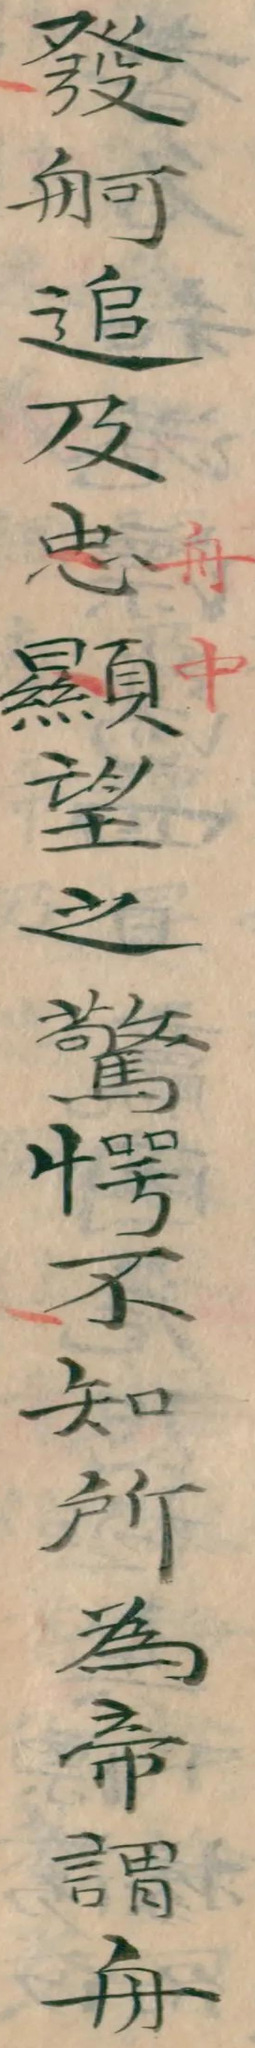発舸追及忠顕舟中望之驚愕不知所為帝謂舟
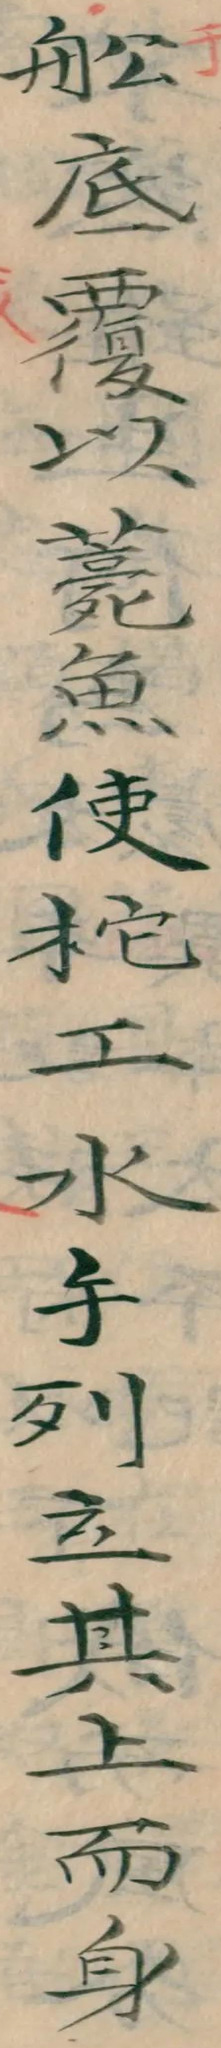于船底覆以薧魚使舵工水手列立其上而身
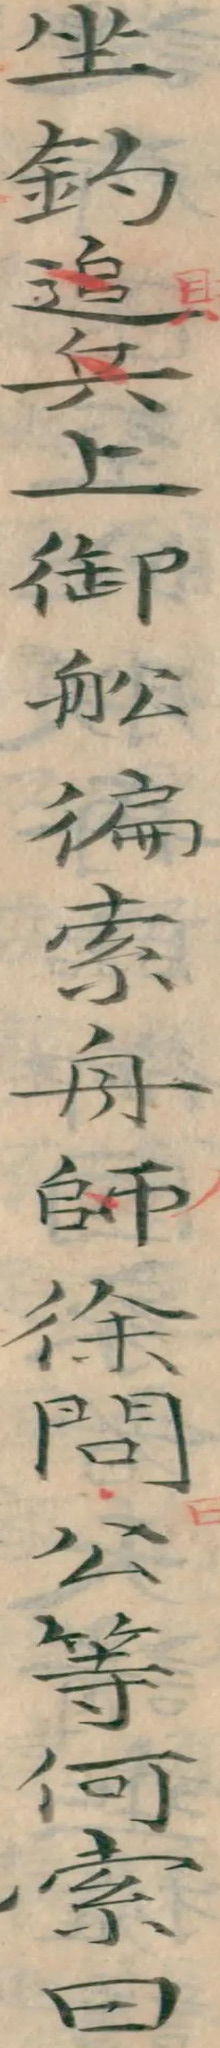坐釣追兵賊上御船徧索舟師人徐問曰公等何索曰
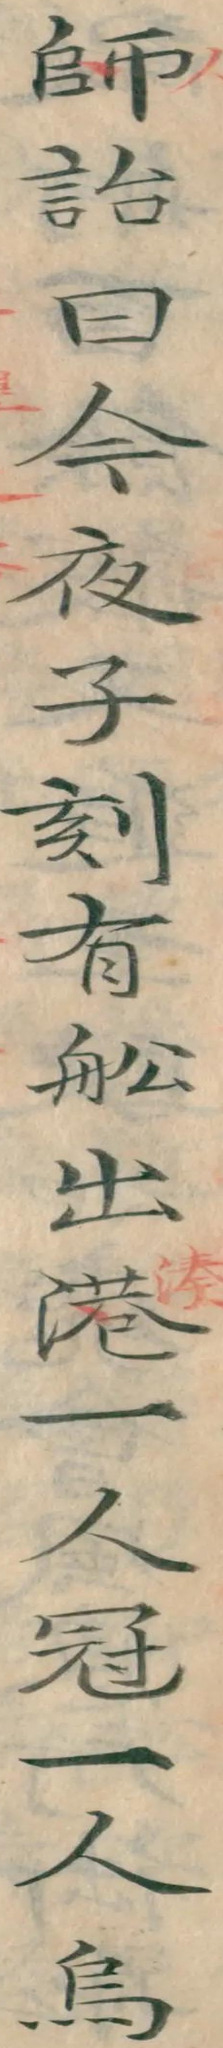師人詒今夜子刻有船出港湊一人冠一人烏

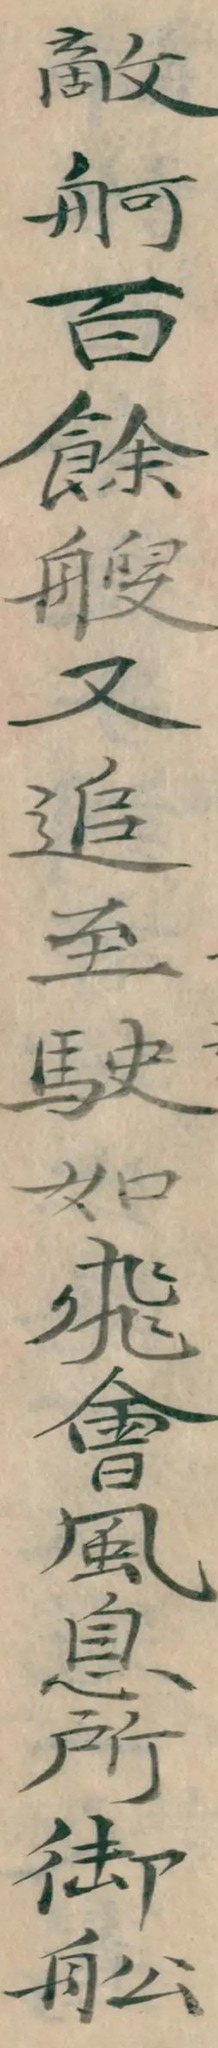敵舸百余艘又追至駛如飛会風息所御船
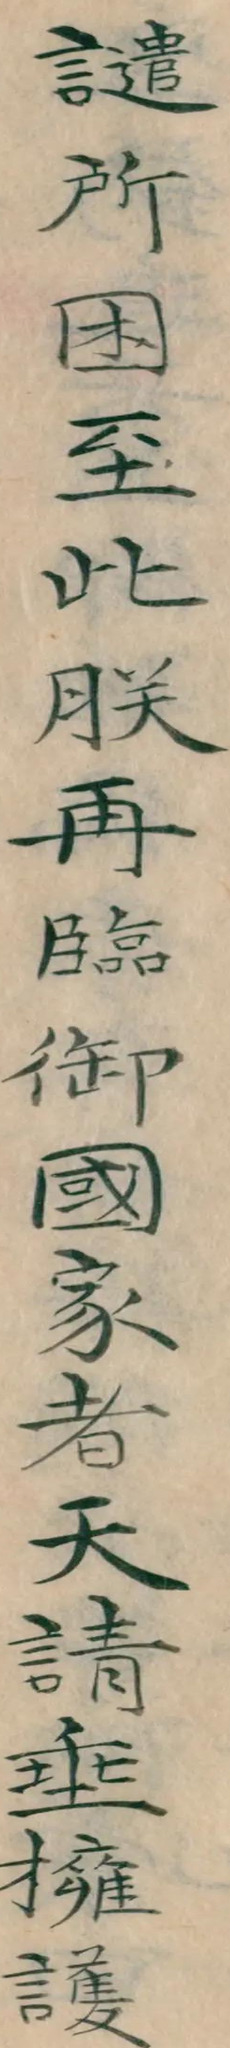譴所因至此朕再臨御国家者天請垂擁護
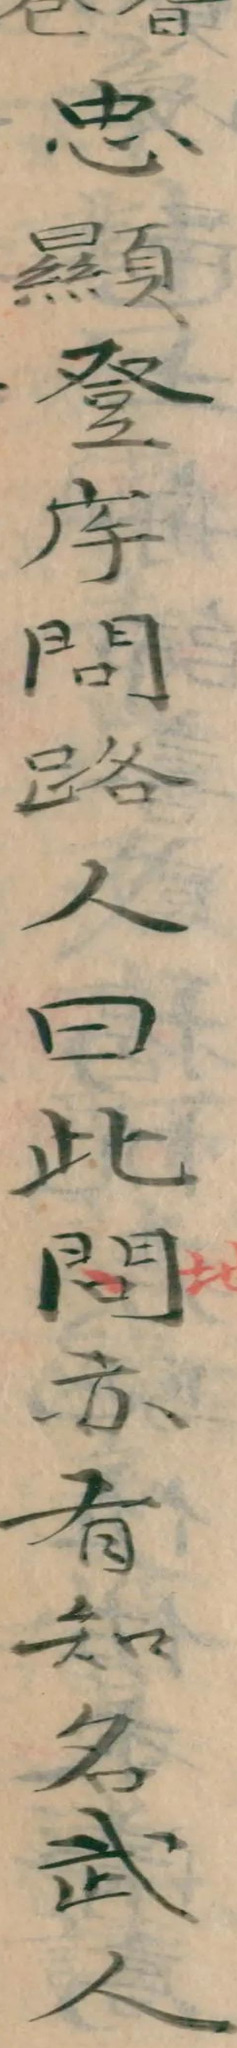耆巻忠顕登問路人曰此問地亦有知名武人
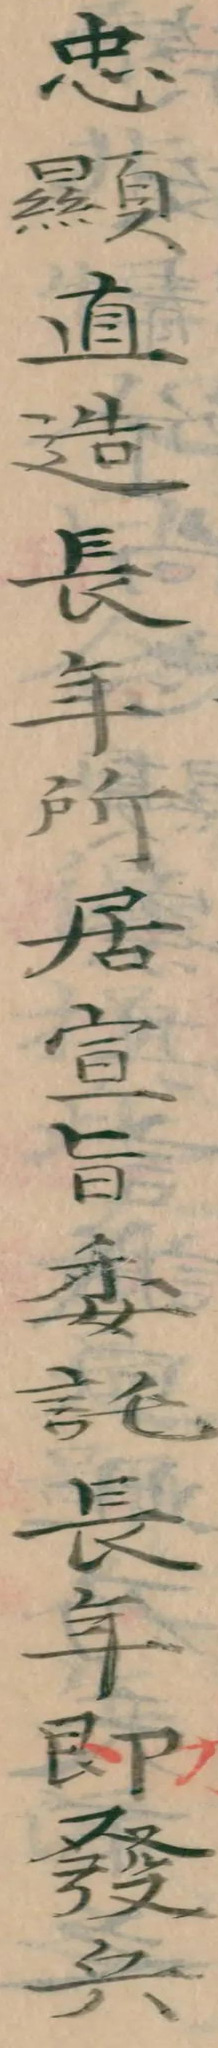忠顕直造長年所居宣旨委託長年即乃発兵
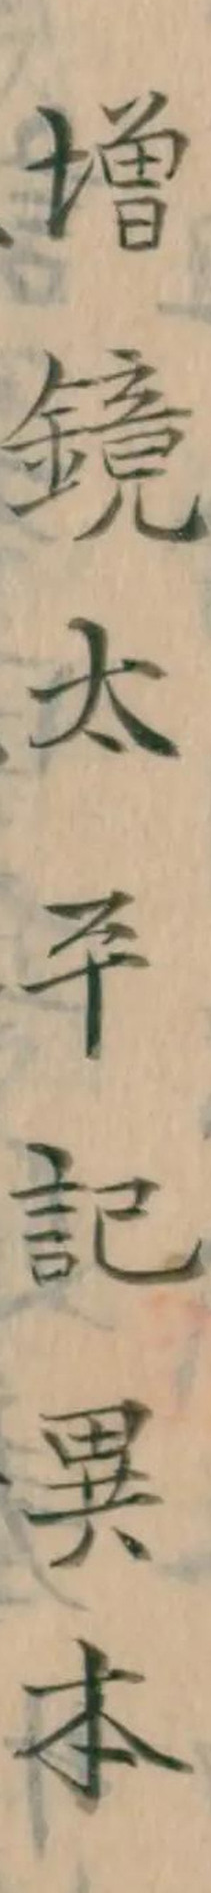増鏡太平記異本
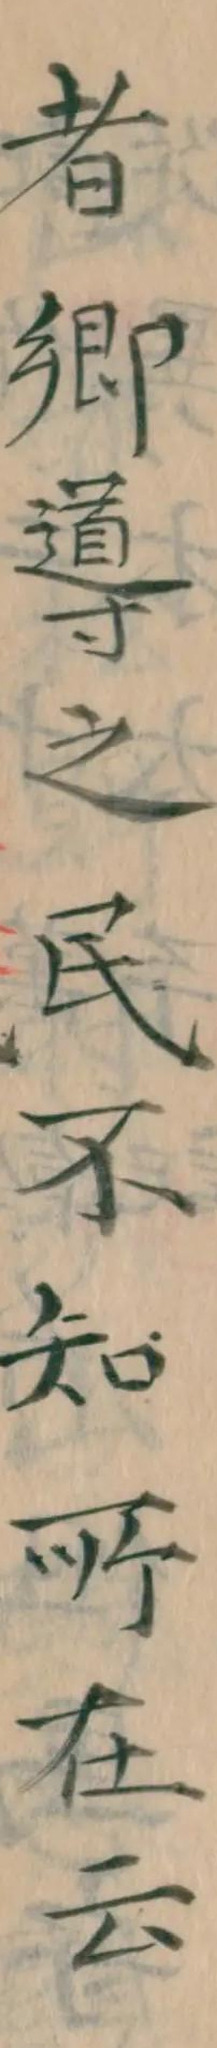者郷導之民不知所在云
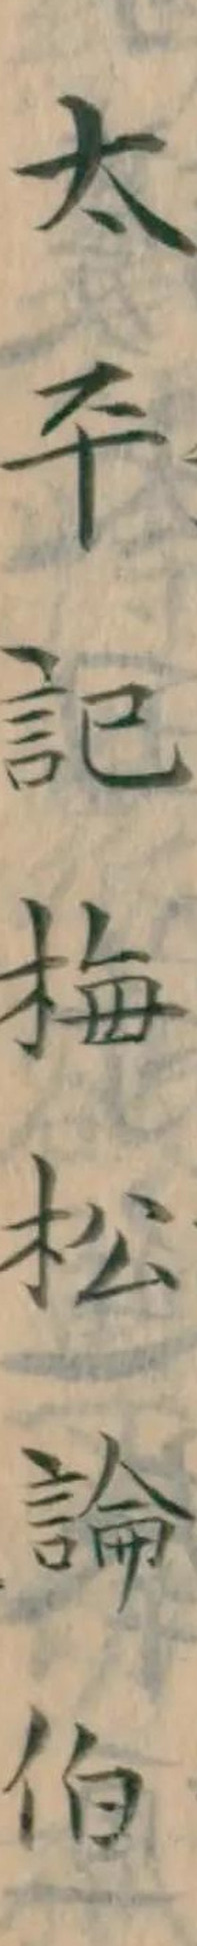太平記梅松論伯
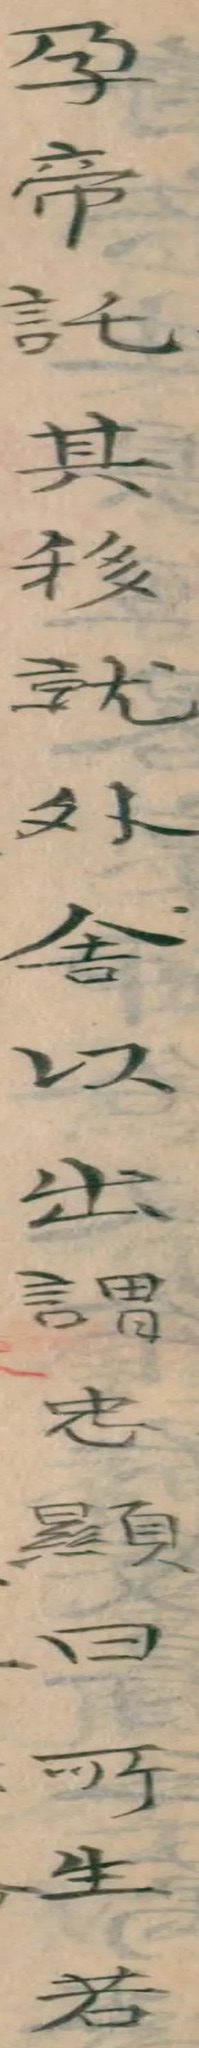孕帝託其移就外舎以出謂忠顕曰所生若
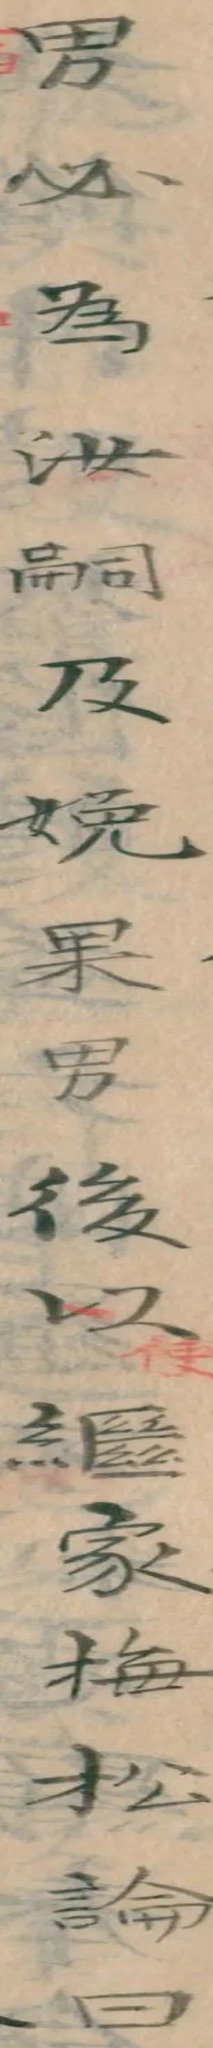男必為汝嗣及娩果男後以使継家梅松論曰
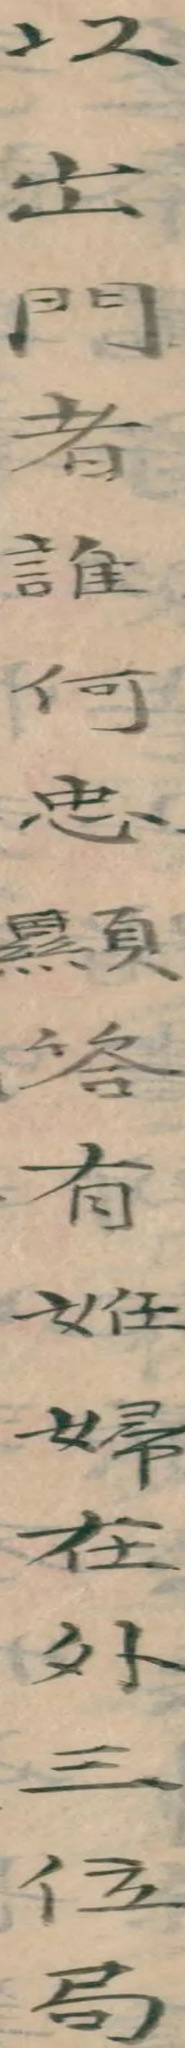以出門者誰何忠顕答有妊婦在外三位局
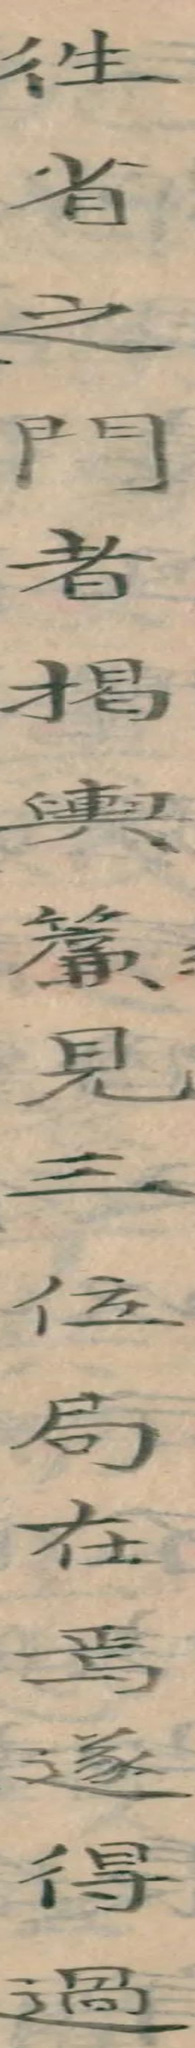往省之門者掲輿簾見三位局在焉遂得過
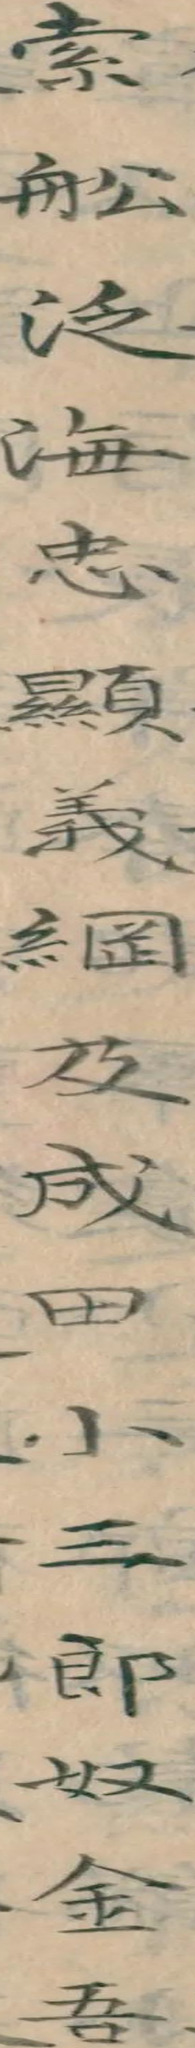索船泛海忠顕義綱及成田小三郎奴金吾
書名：輪池叢書. 12
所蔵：国立国会図書館 National Diet Library, JAPAN
